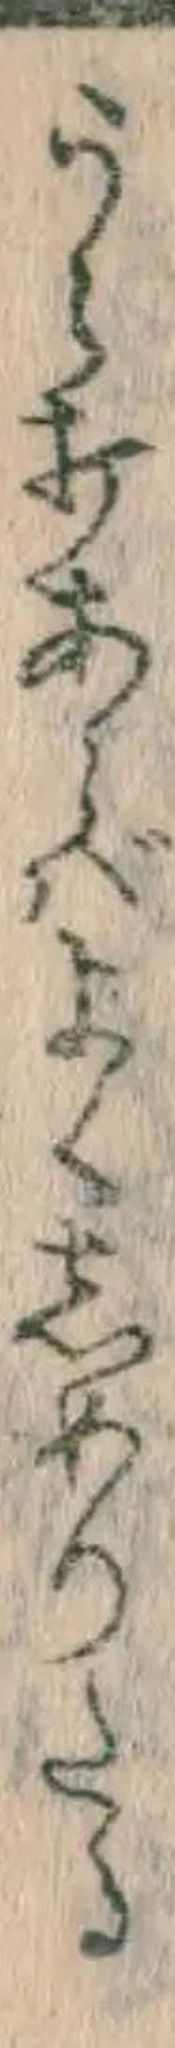うら打あらばよくしめりたる
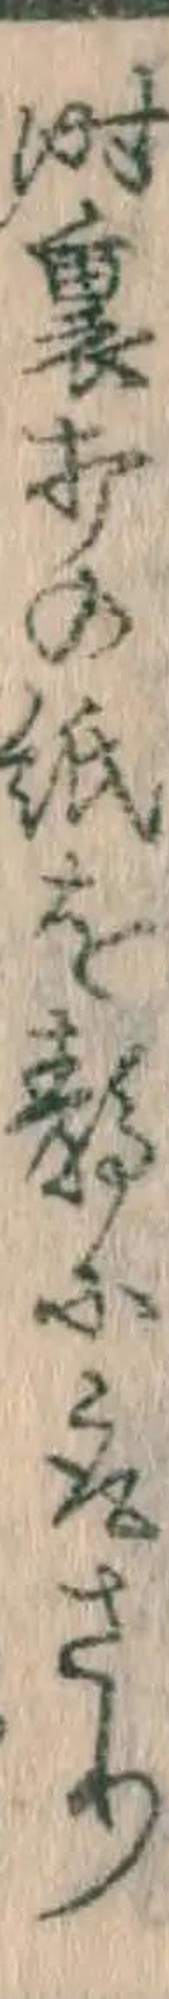時裏打の紙を静に取さり
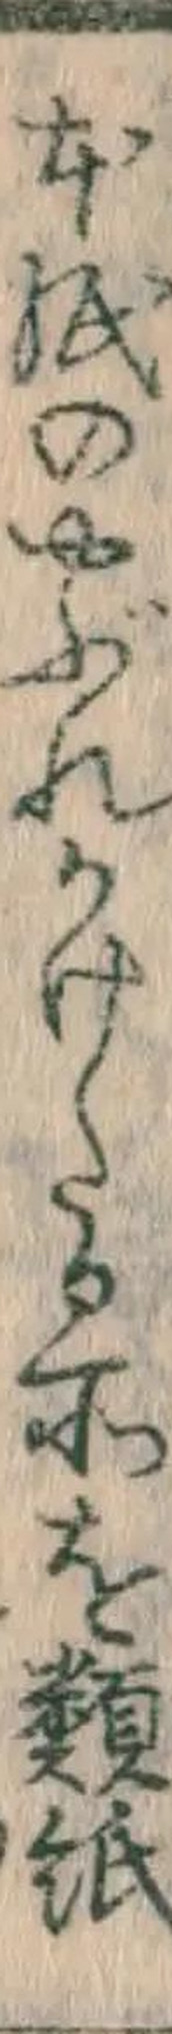本紙のやぶれかけたる所を類紙
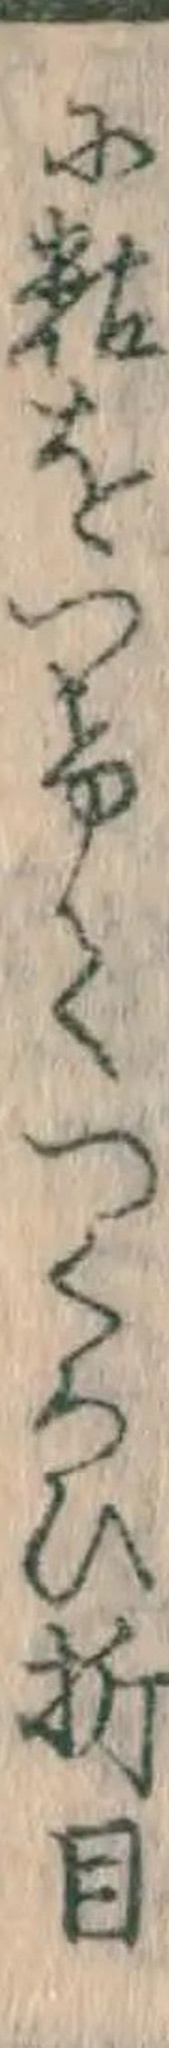に粘をつけてつくろひ折目
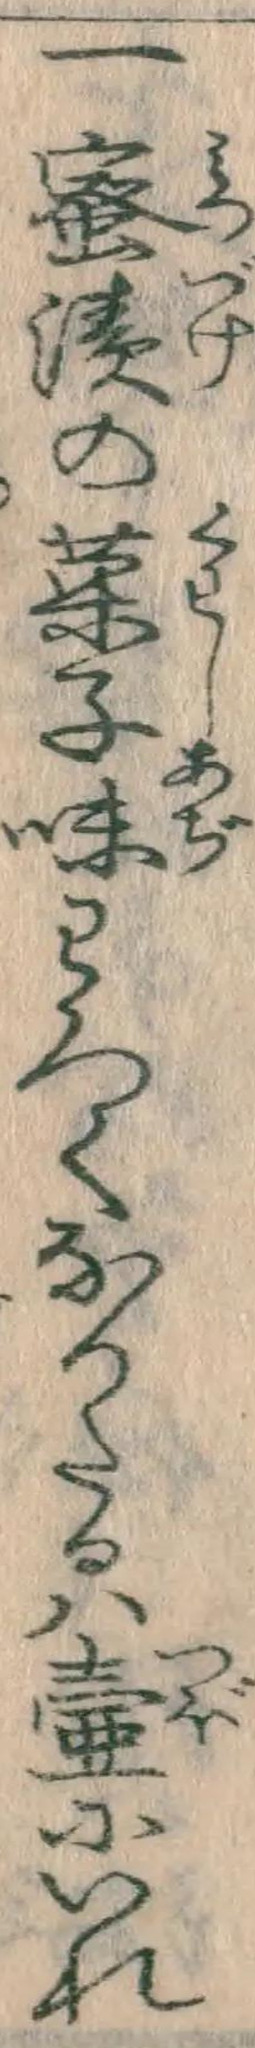一蜜漬の菓子味わろくなりたるは壺にいれ
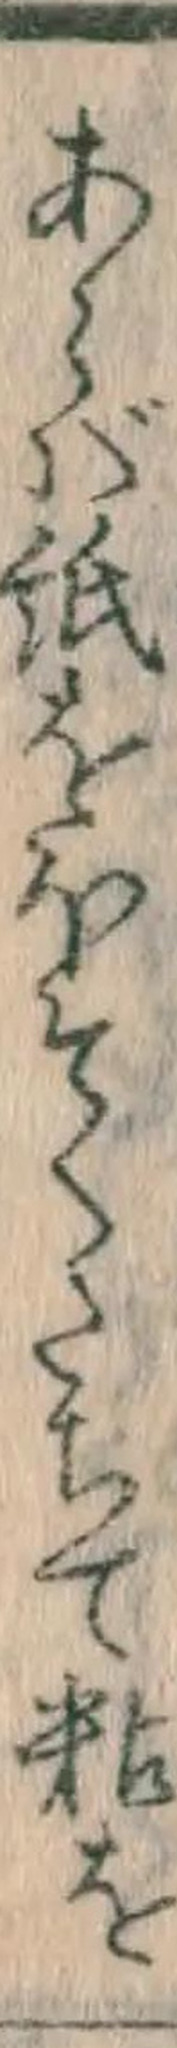あらば紙をほそくたちて粘を
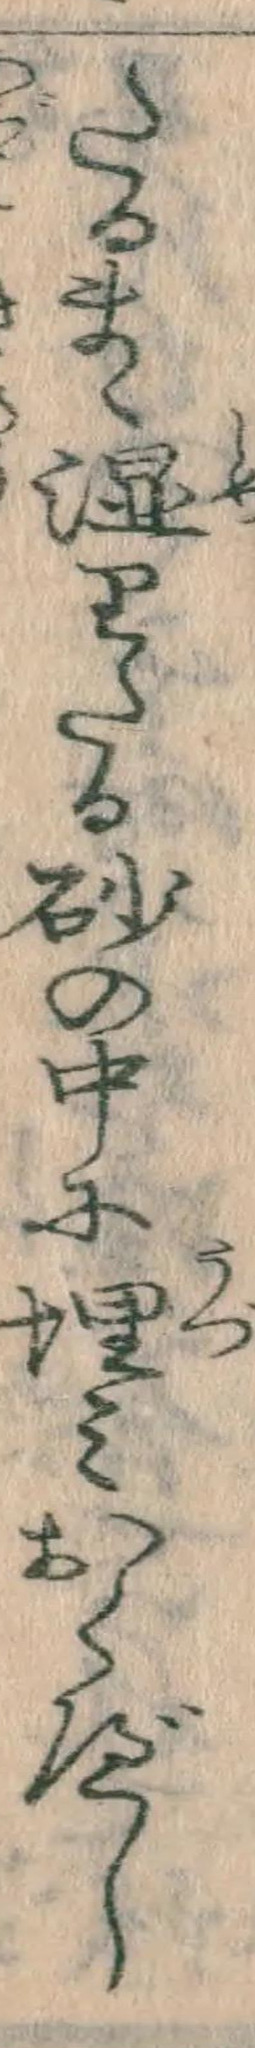たるまゝ湿りたる砂の中に埋みおくべし
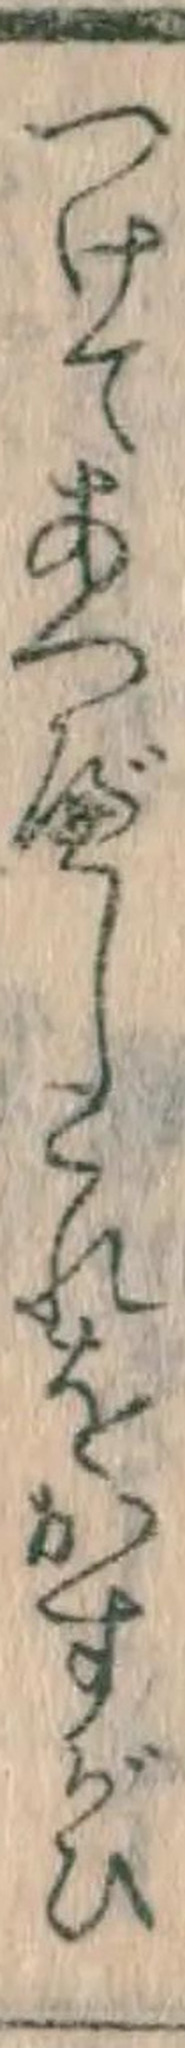つけてあつべしこれをかすがひ
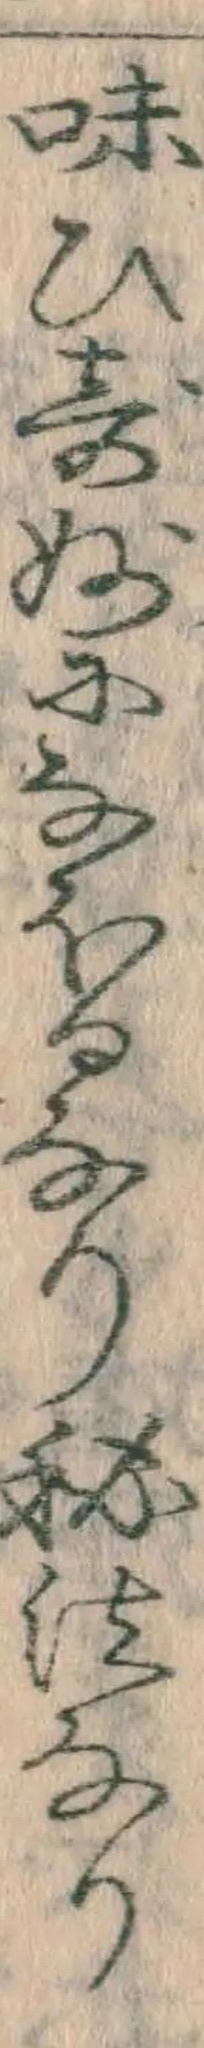味ひ奇妙になほるなり秘法なり
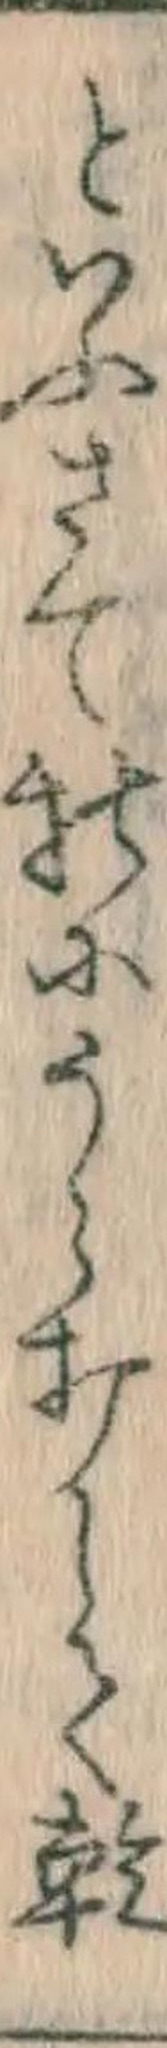といふさて新にうら打して乾
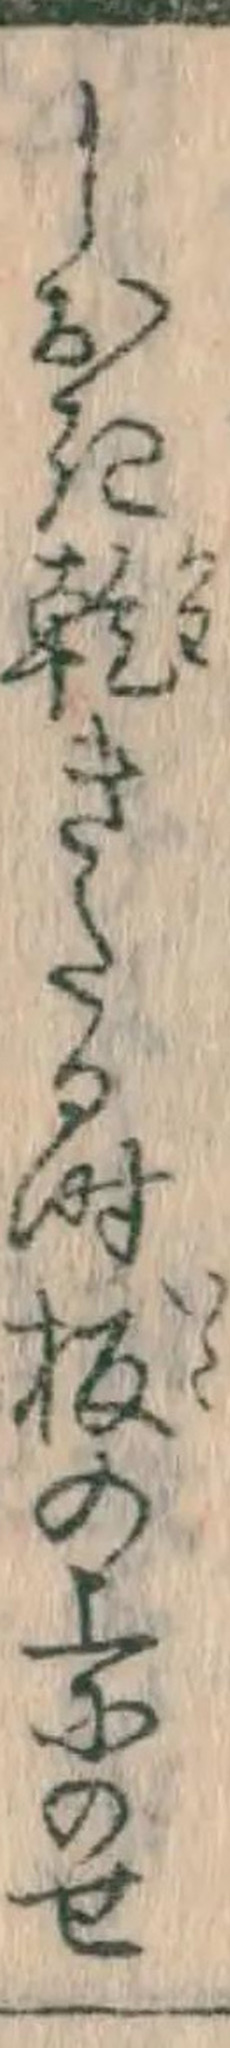しおき乾きたる時板の上にのせ
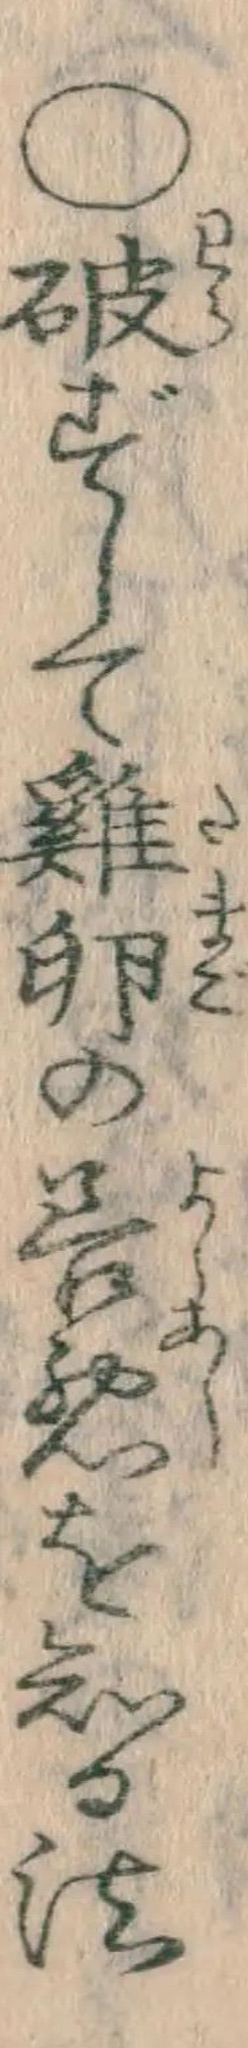○破ずして鶏卵の善悪を知る法
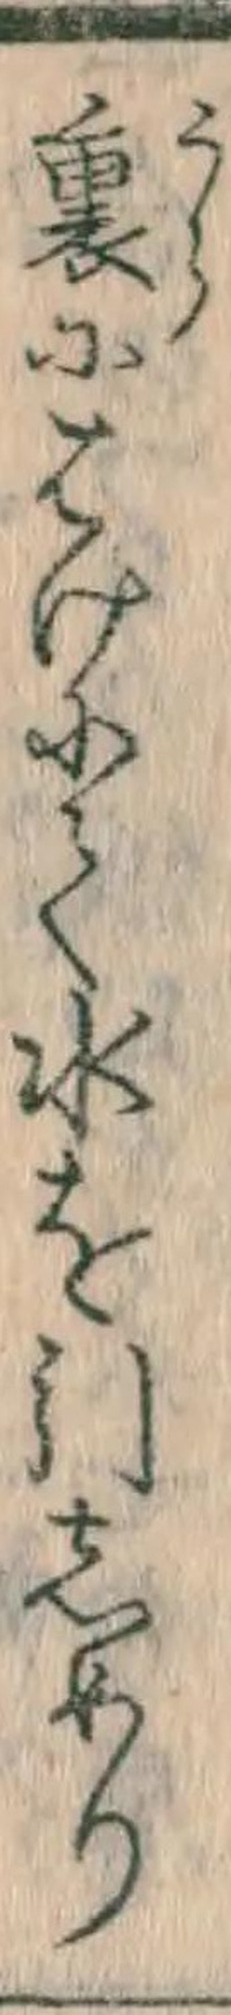裏にはけにて水を引しめり
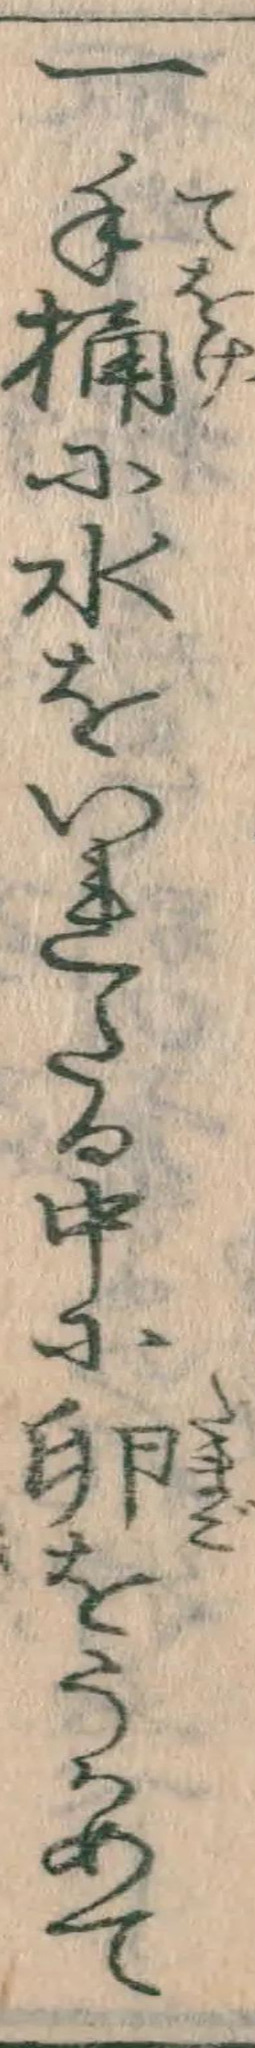一手桶に水をいれたる中に卵をうかめて
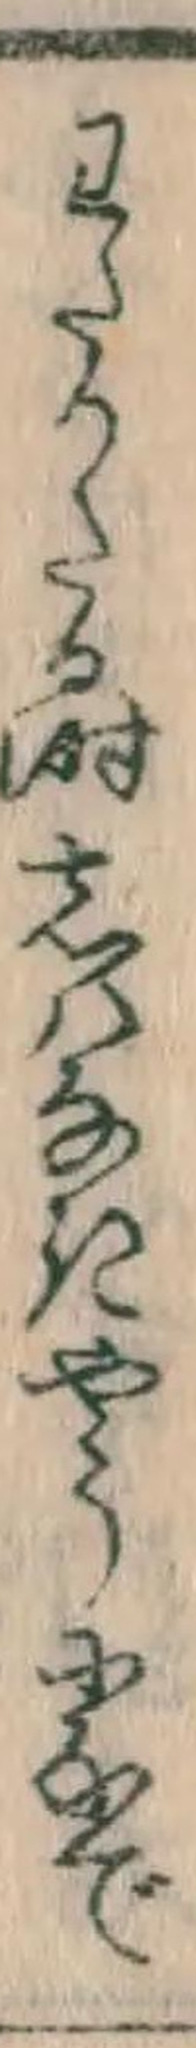わたりたる時しはなきやうになで
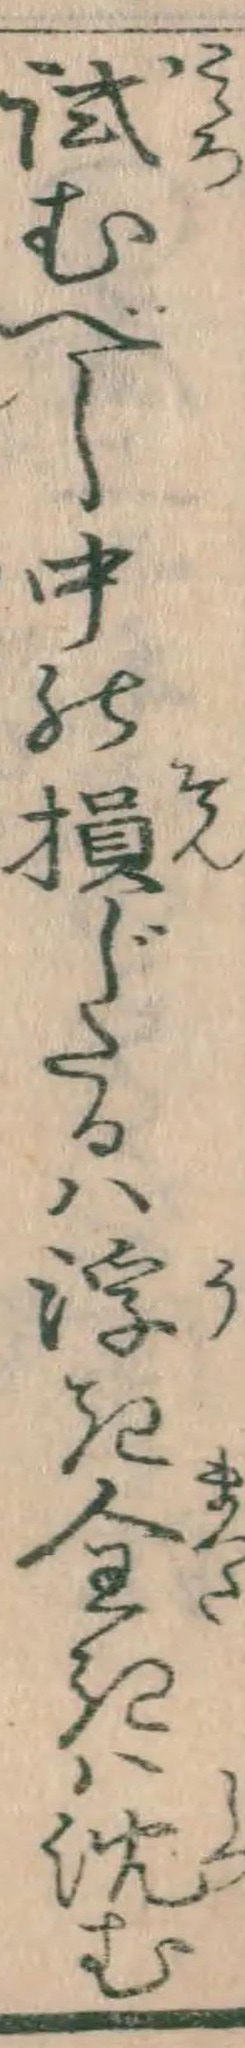試むべし中の損じたるは浮き全きは沈む
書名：広益秘事大全 3巻. [2]
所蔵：国立国会図書館 National Diet Library, JAPAN
